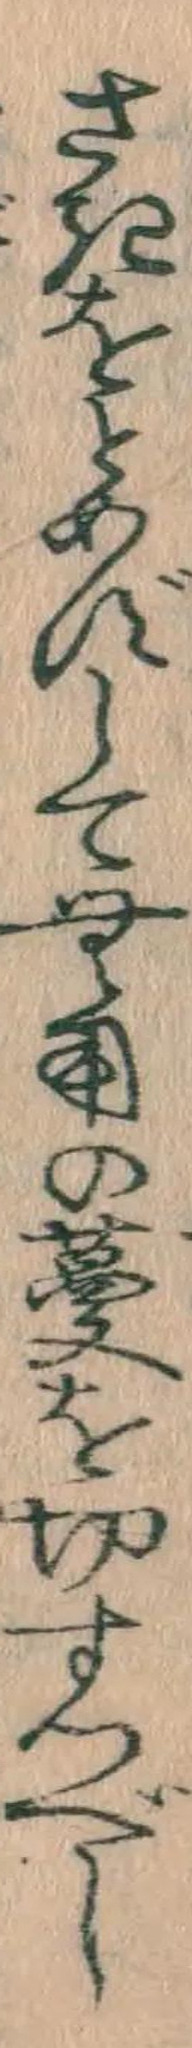さきをとめずして無用の蔓を切すつべし
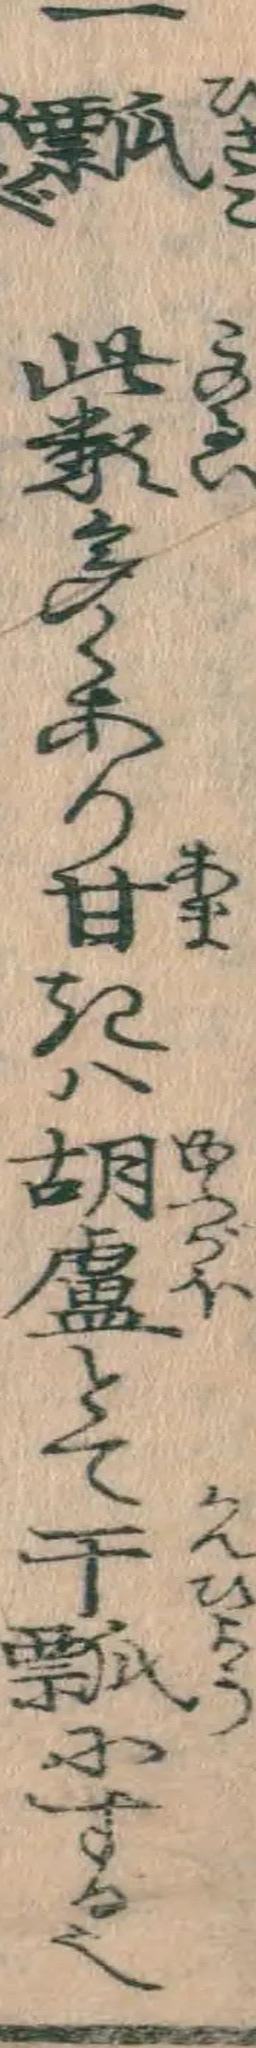一瓢此類多くあり甘きは胡盧とて干瓢にする也
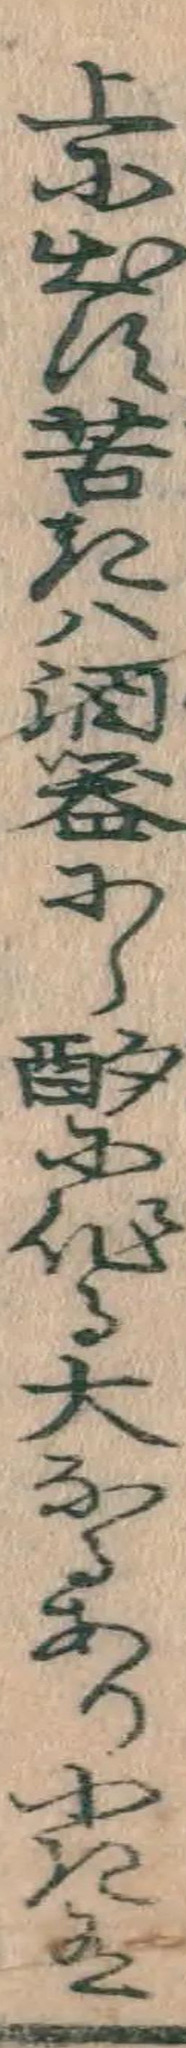上に出す苦きは酒器にし酌に作る大なるあり小き有
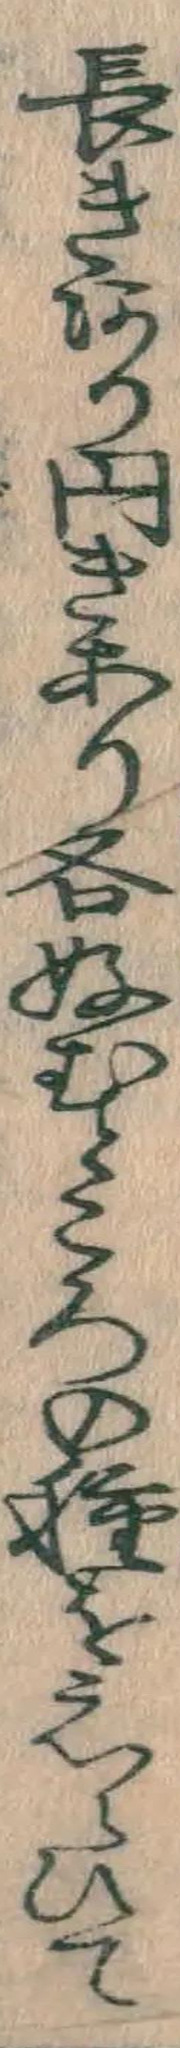長きあり円きあり各々好むところの種をえらひて
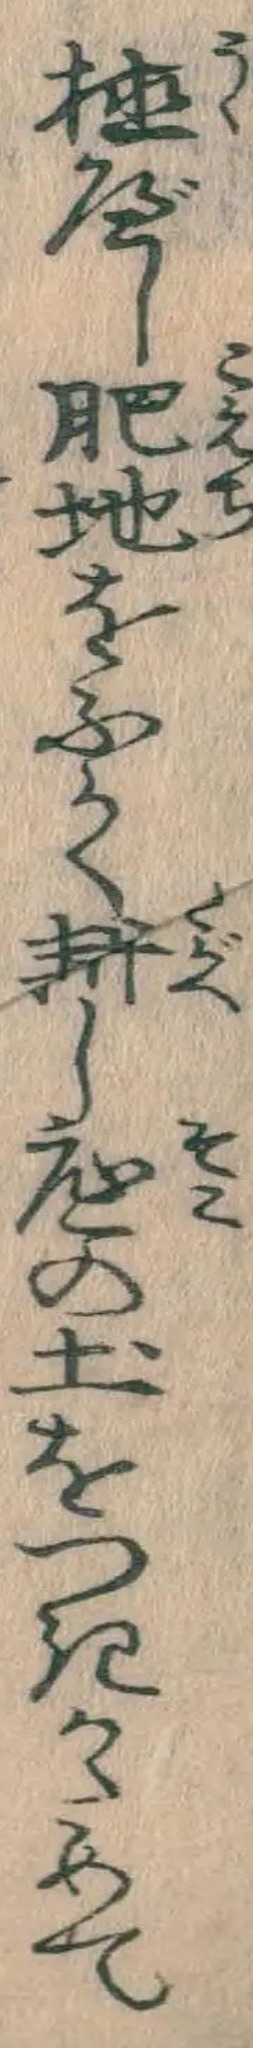植べし肥地をふかく耕し底の土をつきかためて
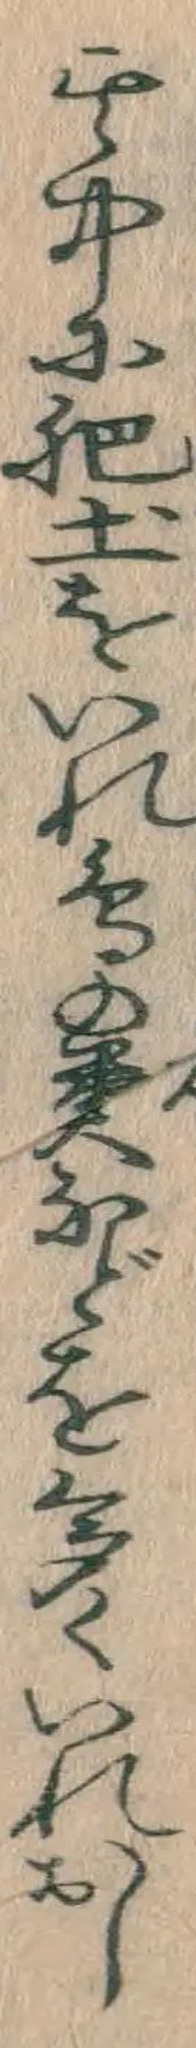其中に肥土をいれ鳥の糞などを多くいれおし
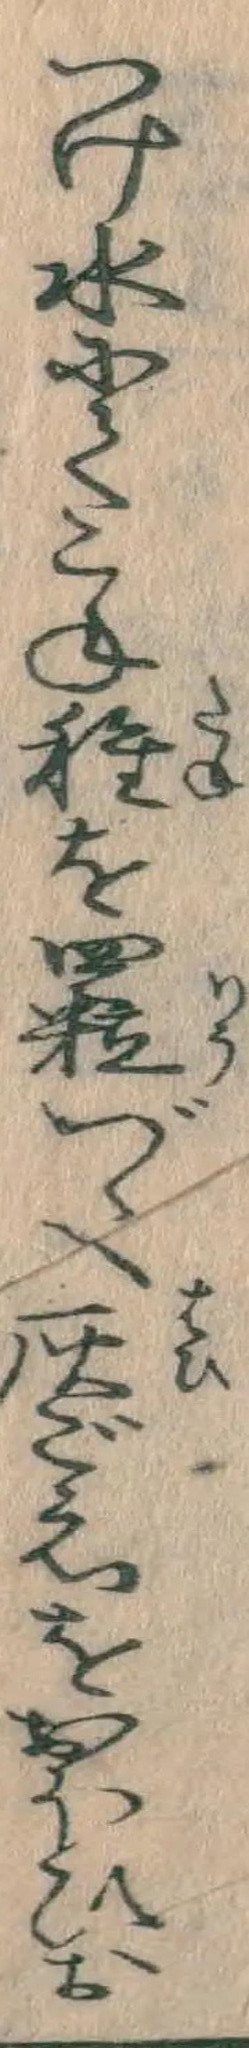つけ水にてこね種を四粒づゝ入灰ごえをおほひお
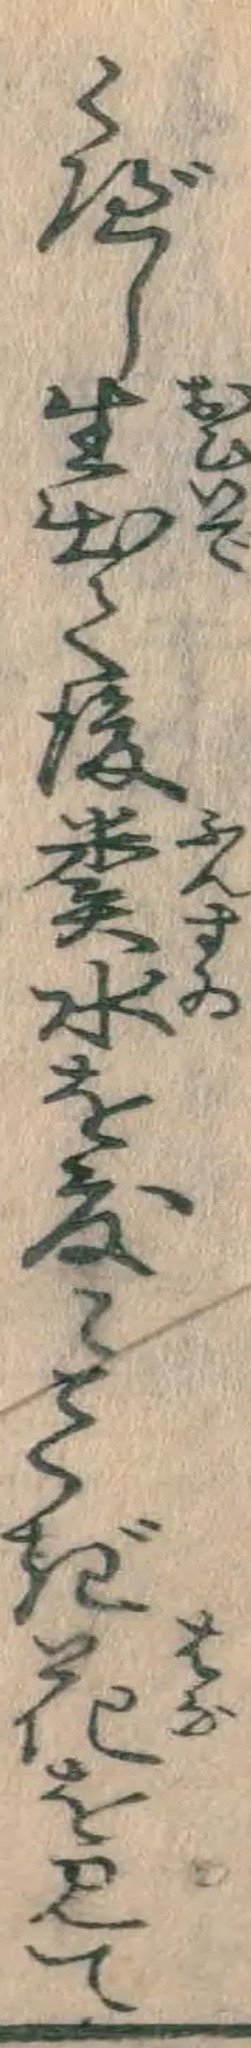くべし生出て後糞水を度々そゝぎ花を見て
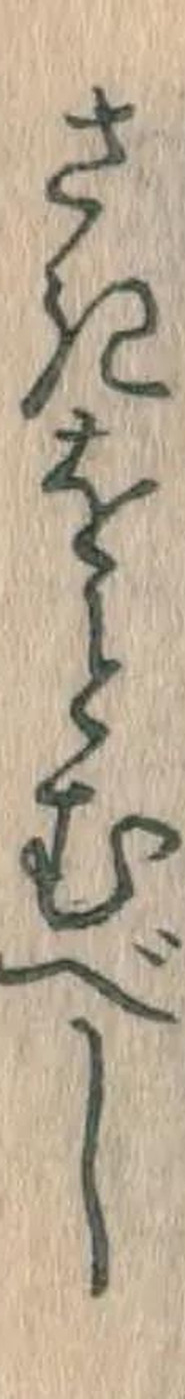さきをとむべし
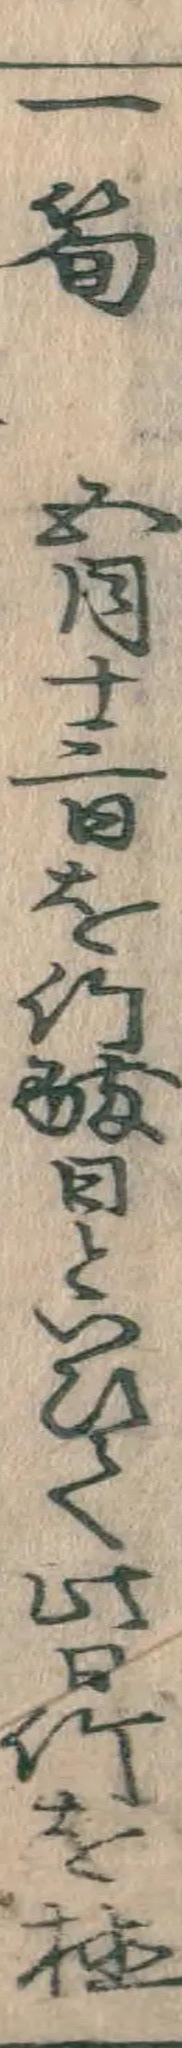一筍五月十三日を竹酔日といひて此日竹を植
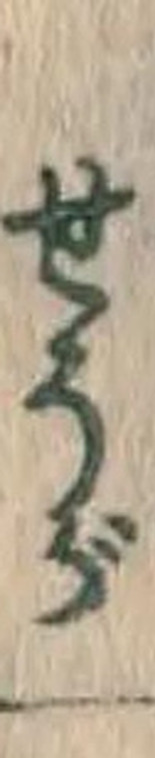せうが
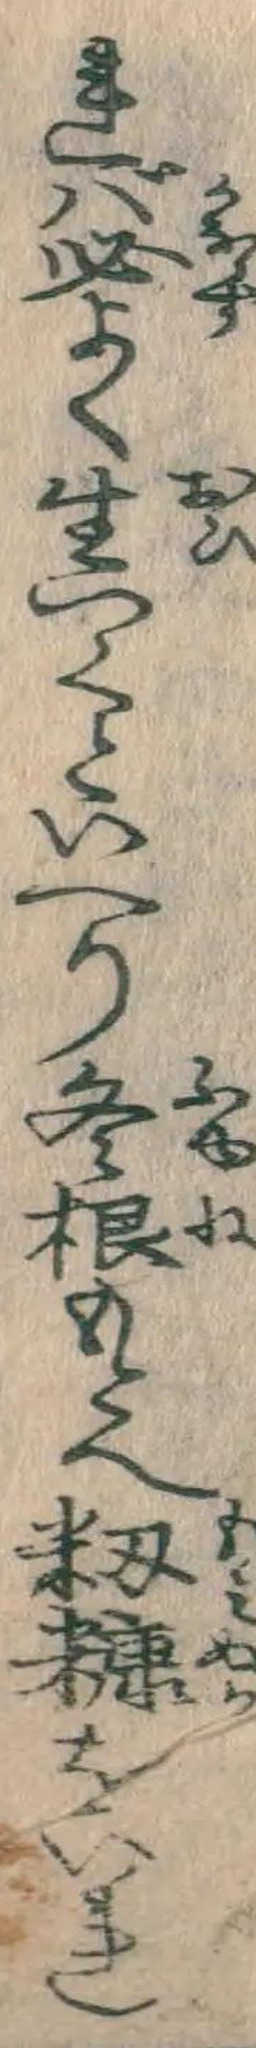れば必よく生つくといへり冬根もとへ籾糠をいれ
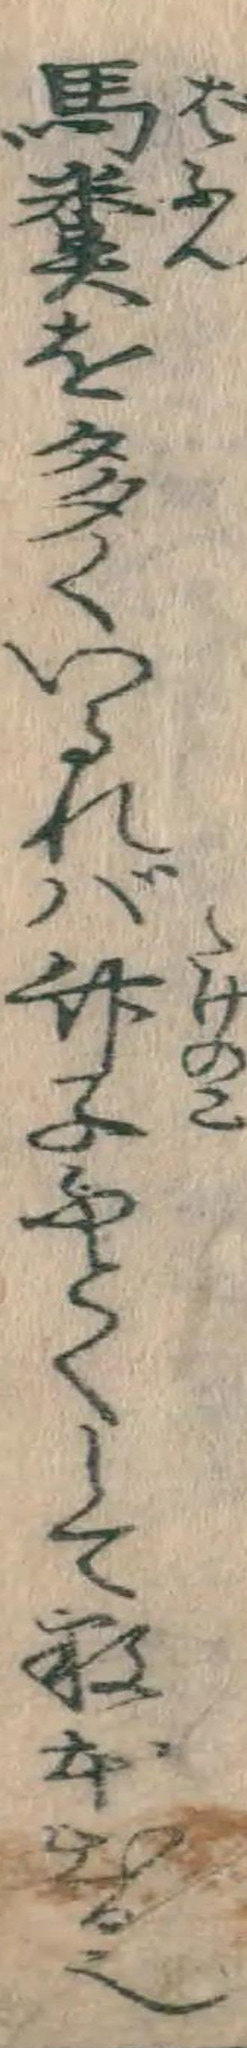馬糞を多くいるれば竹子ふとくして数本出る也
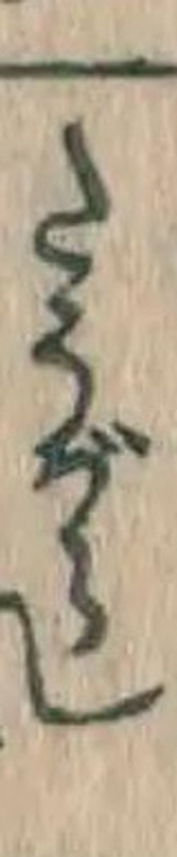たうがらし
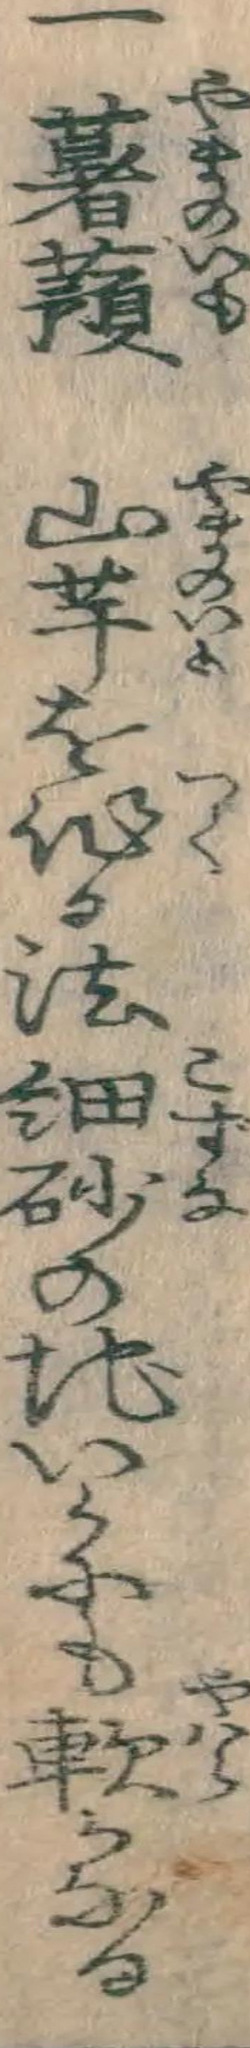一薯蕷山芋を作る法細砂の地いかにも軟かなる

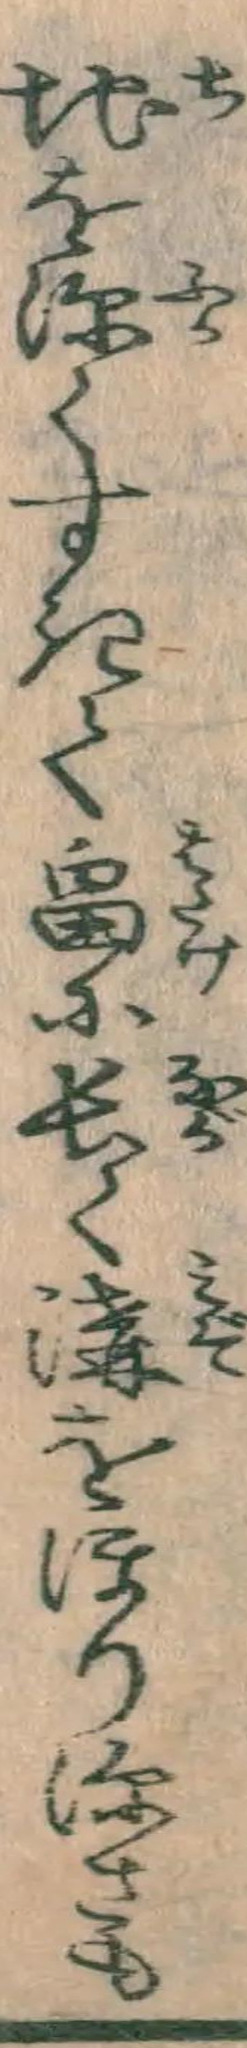地を深くすきて畠に長く溝をほり深さも
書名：広益秘事大全 3巻. [5]
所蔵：国立国会図書館 National Diet Library, JAPAN
